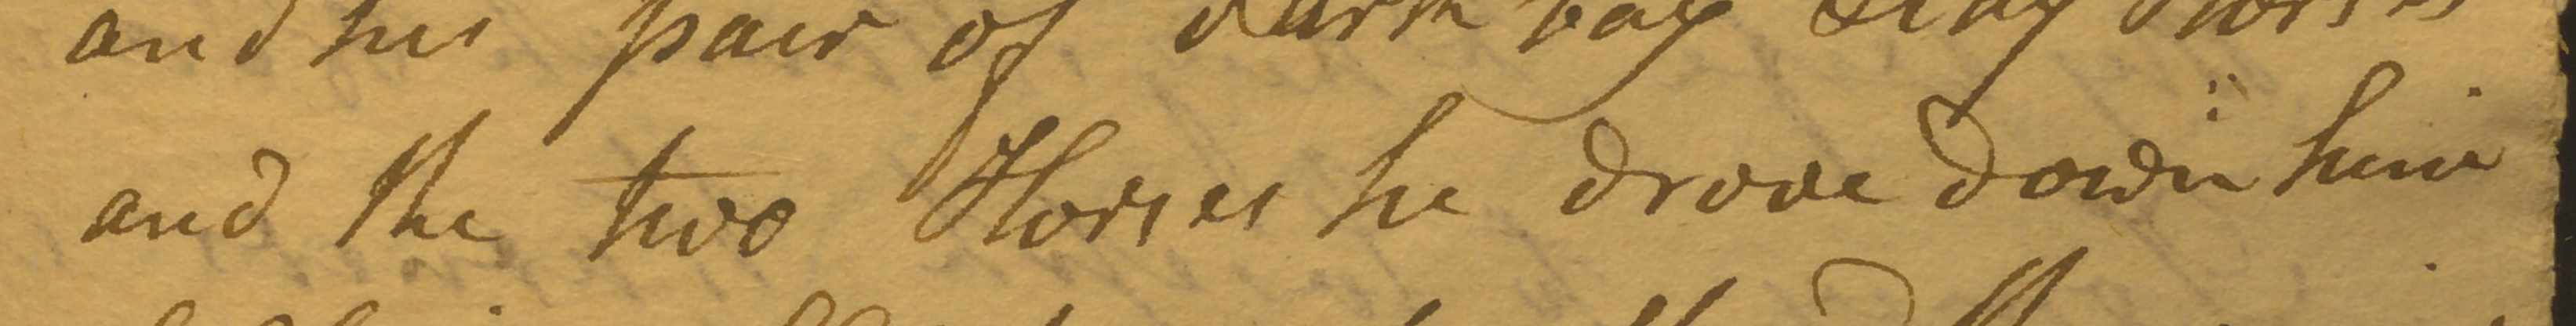and the two Horses he drove down him
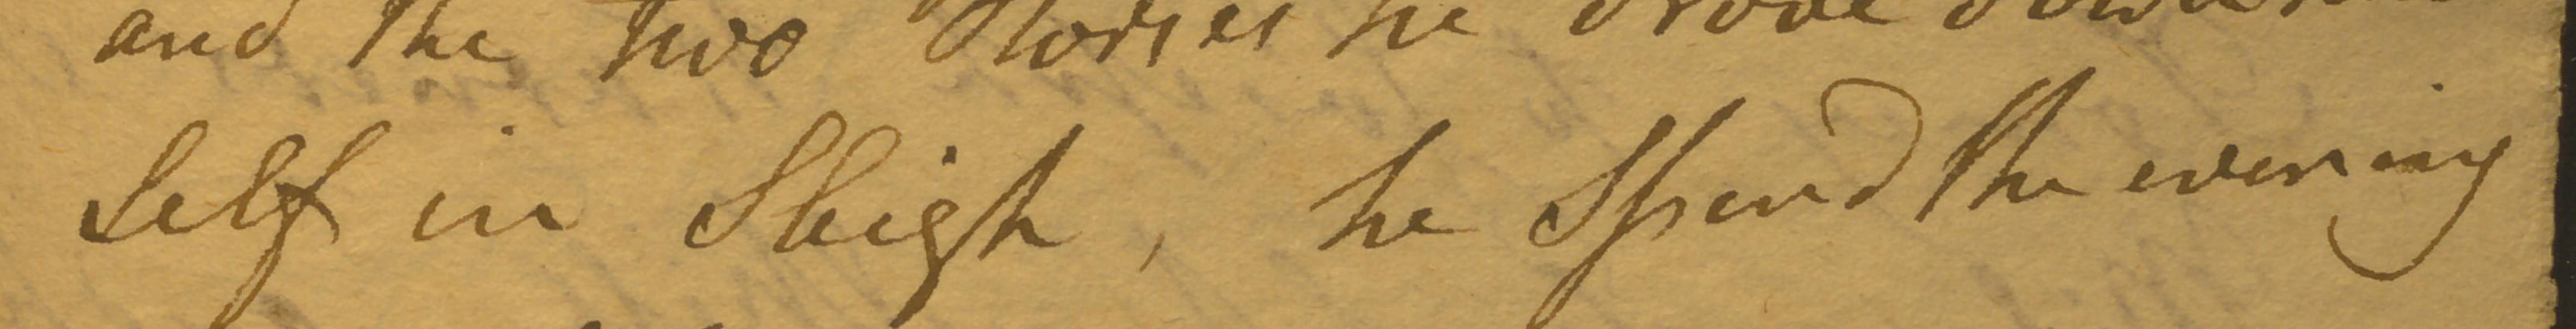self in Sleigh, he spend the evening
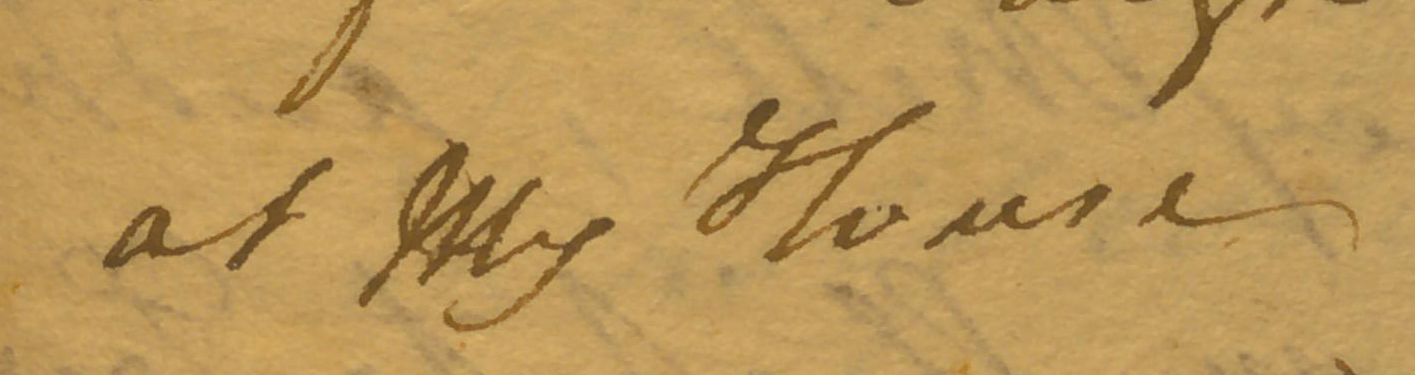at My House
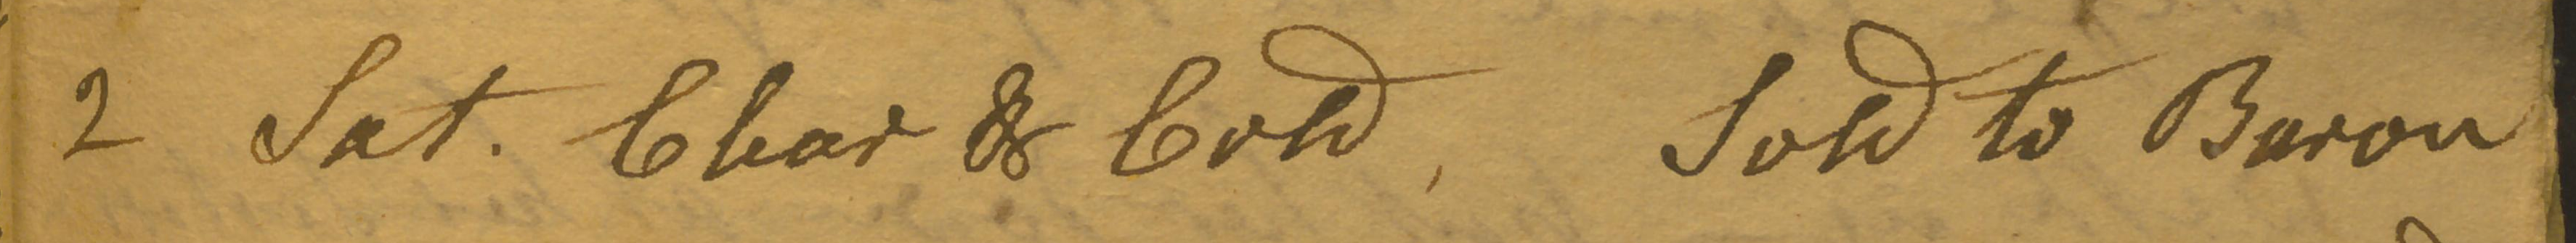2 Sat. Clear & Cold, Sold to Baron
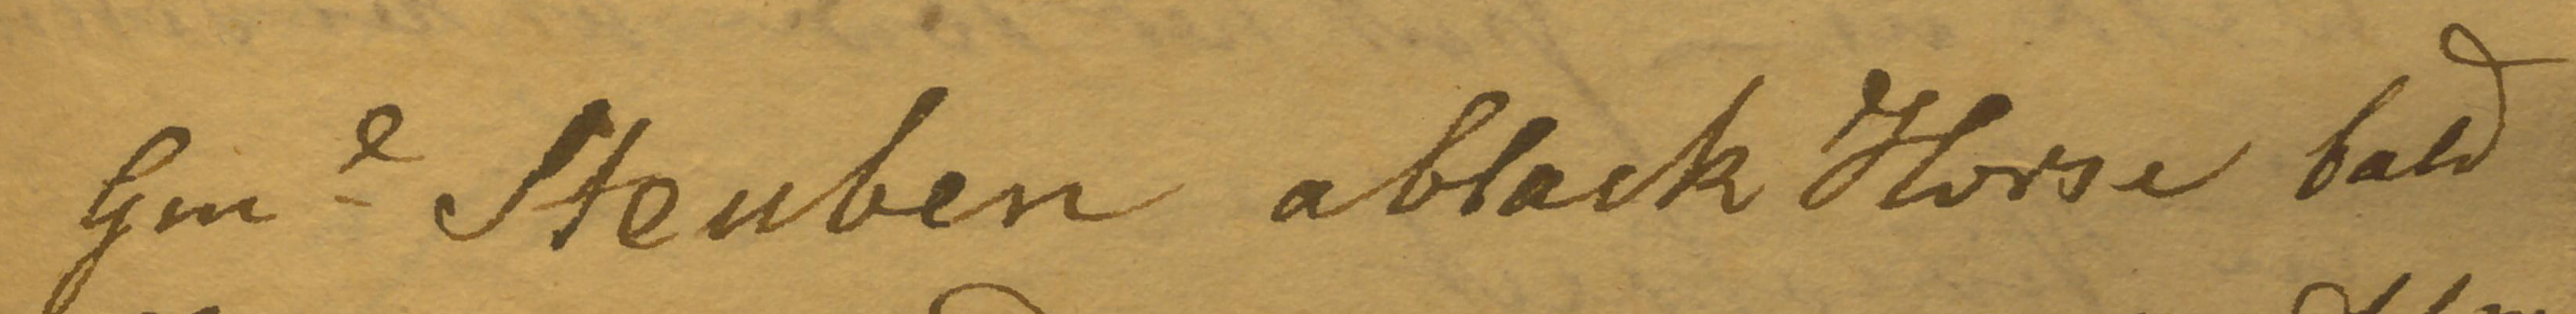Gen^l. Steuben a black Horse bald
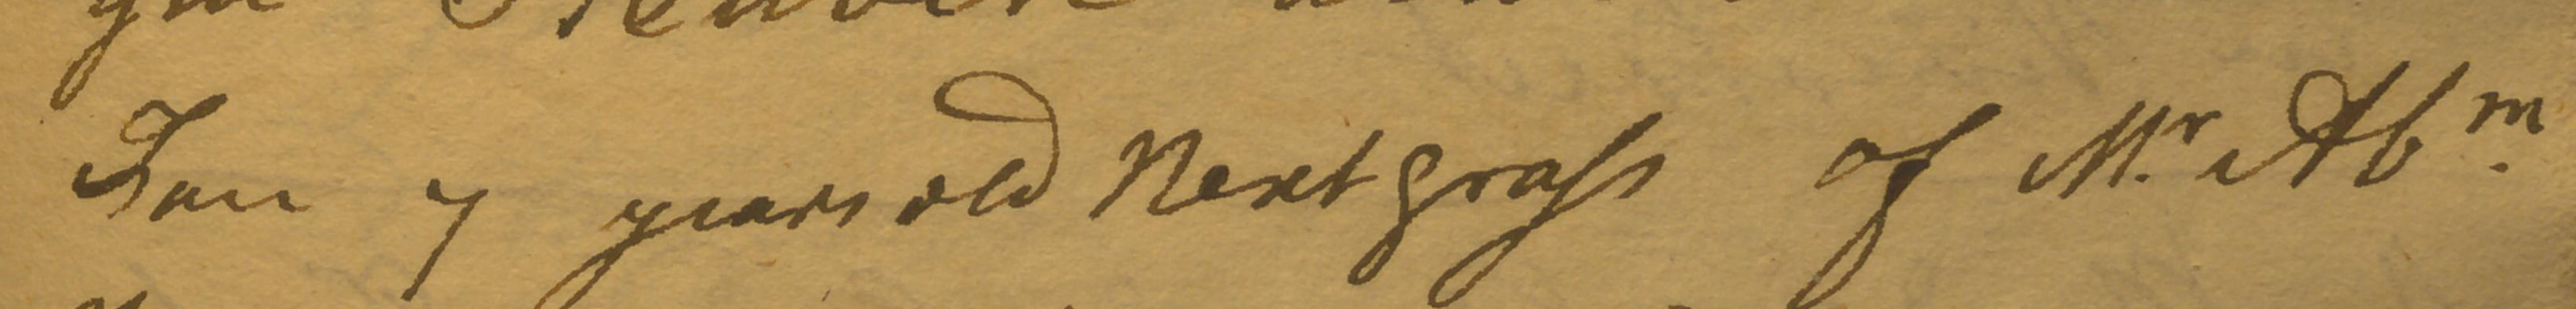Fan 7 years old Next grass of M^r. Ab^m.
